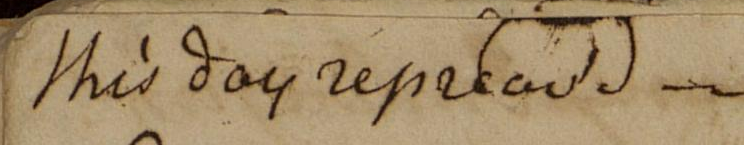this day repreav'd-
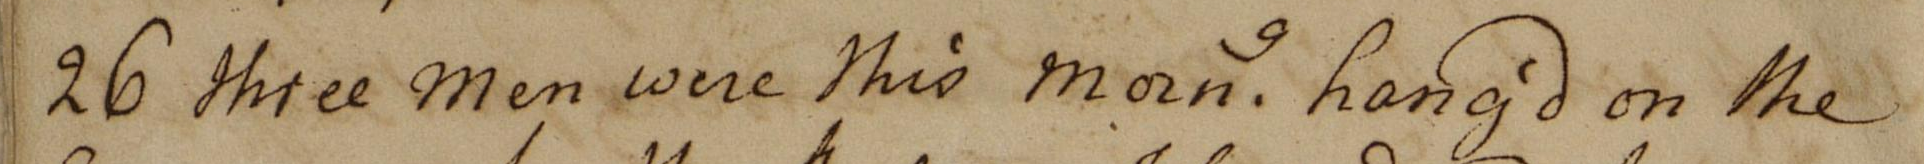26 three men were this morn^g. hang'd on the
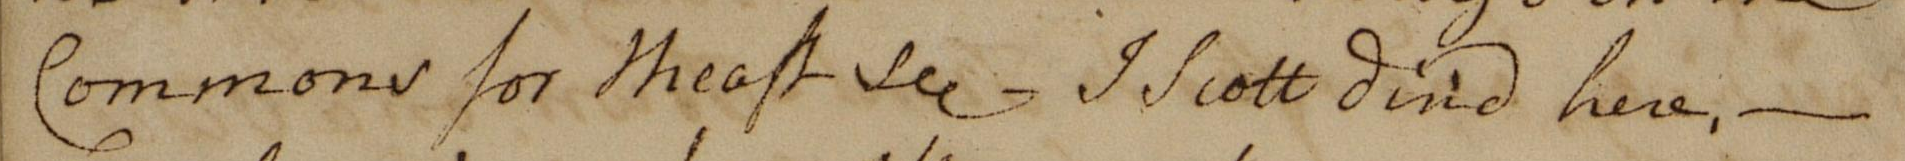Commons for theaft &c- I Scott din'd here,-
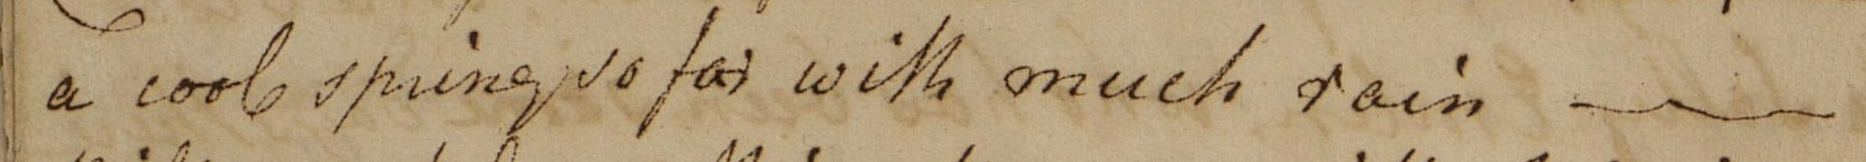a cool spring so far with much rain-
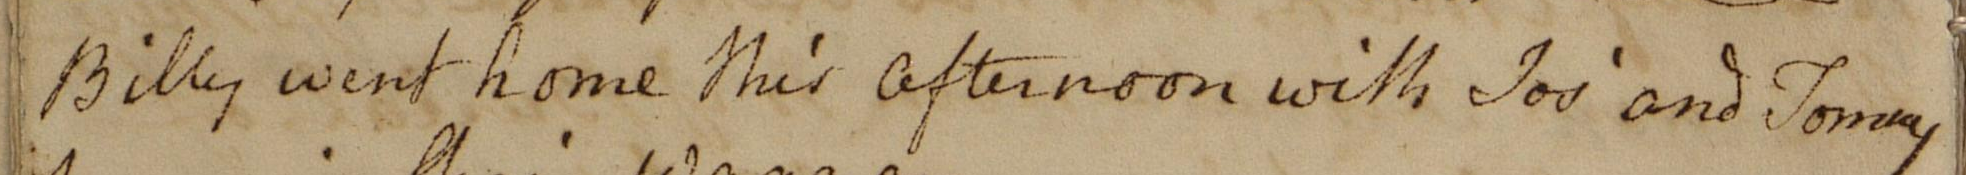Billy went home this afternoon with Jos and Tommy
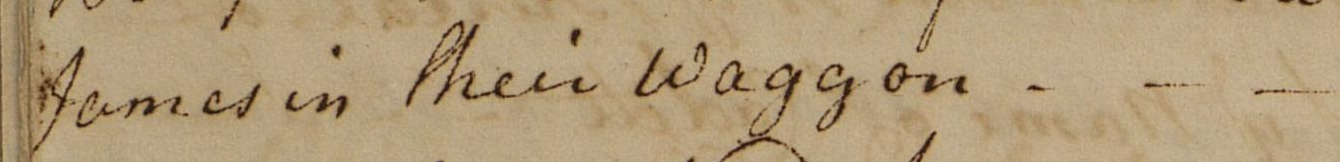James in their Waggon.--
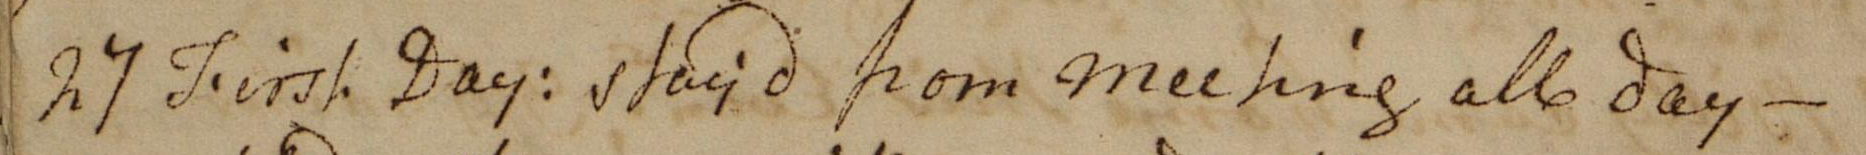27 First Day: stay'd from meeting all day-
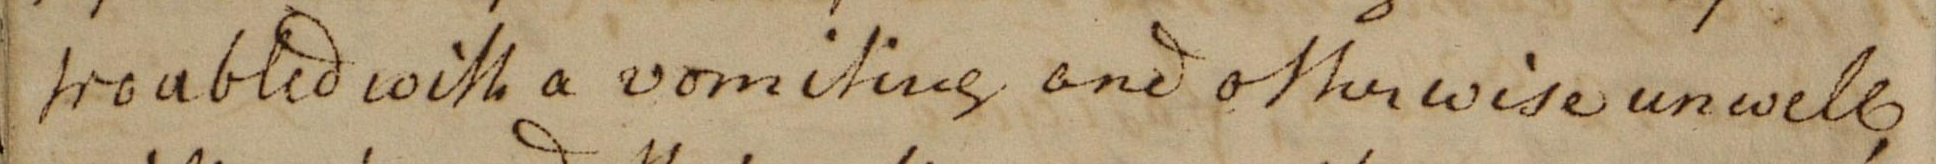troubled with a vomiting and otherwise unwell,
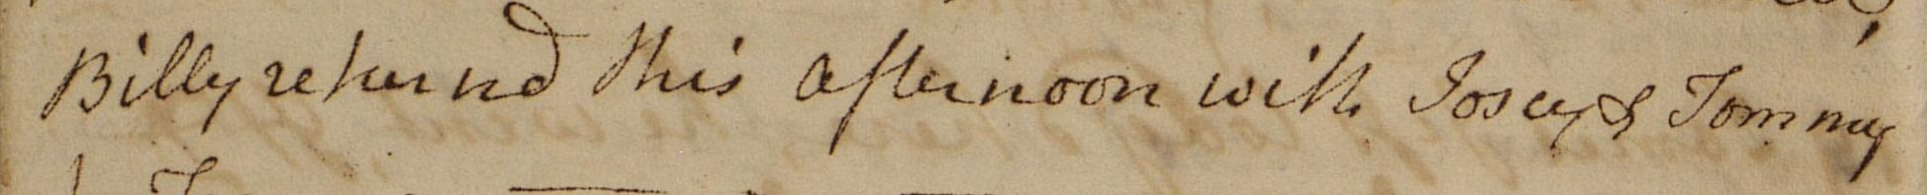Billy returnd this afternoon with Josey & Tommy
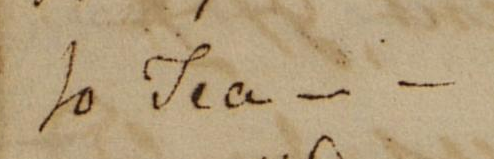to Tea--
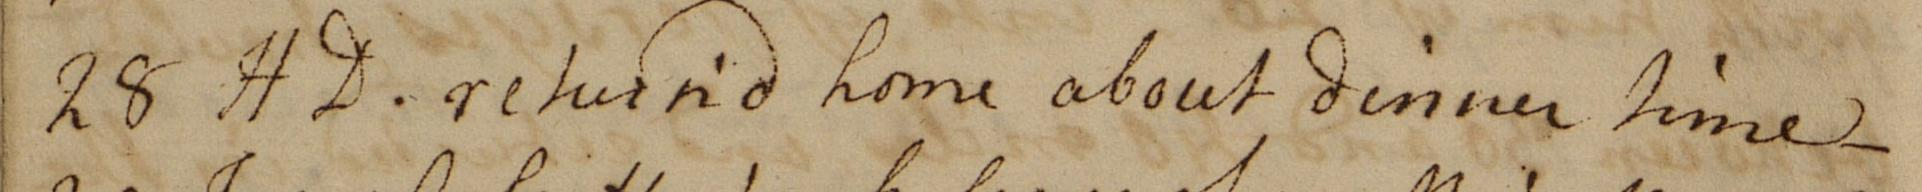28 HD return'd home about dinner time-
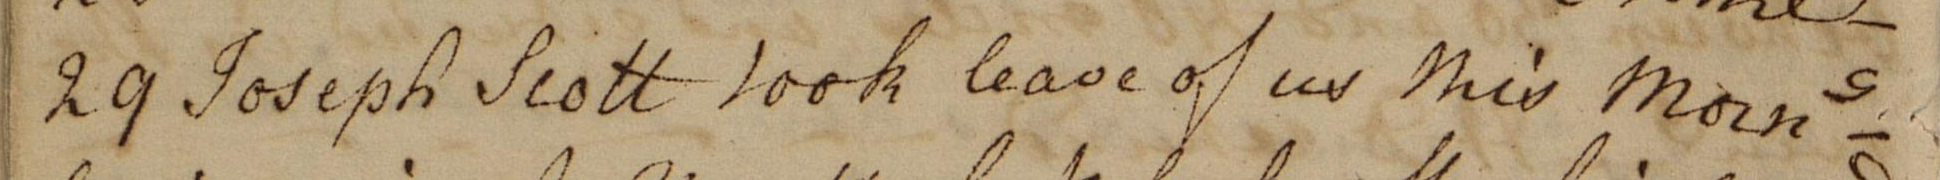29 Joseph Scott took leave of us this Morn^g
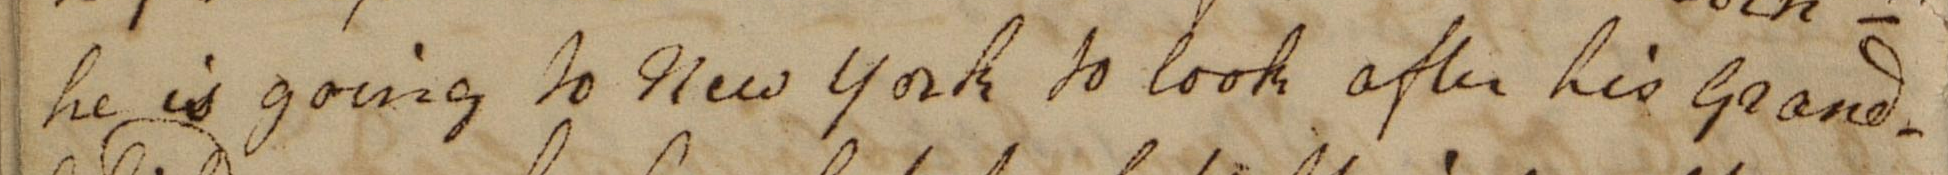he is going to New York to look after his Grand-
